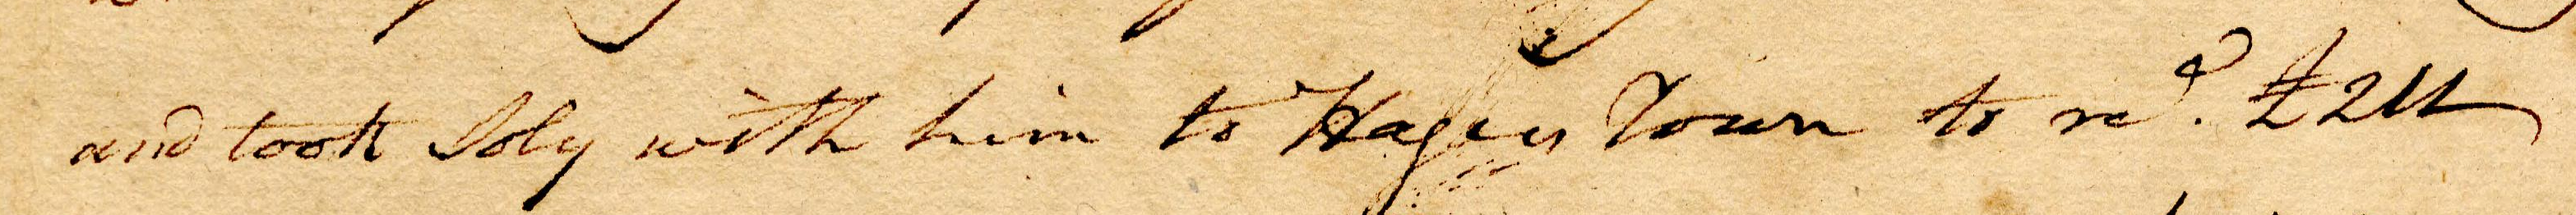and took Soly with him to Hayes Town to re^d. £211
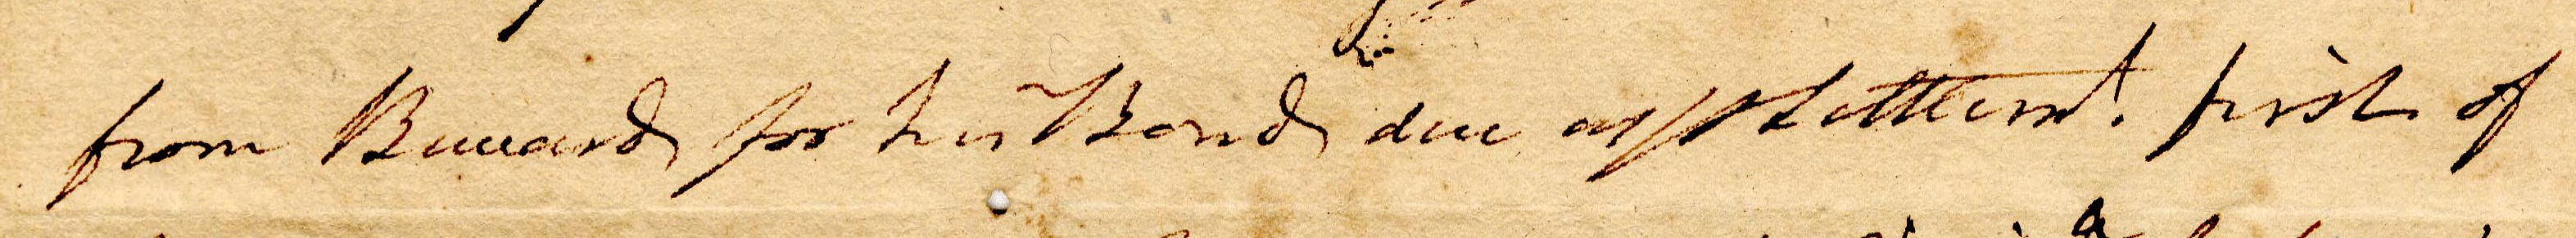from Barnard for his Bond due as per attem^t. first of
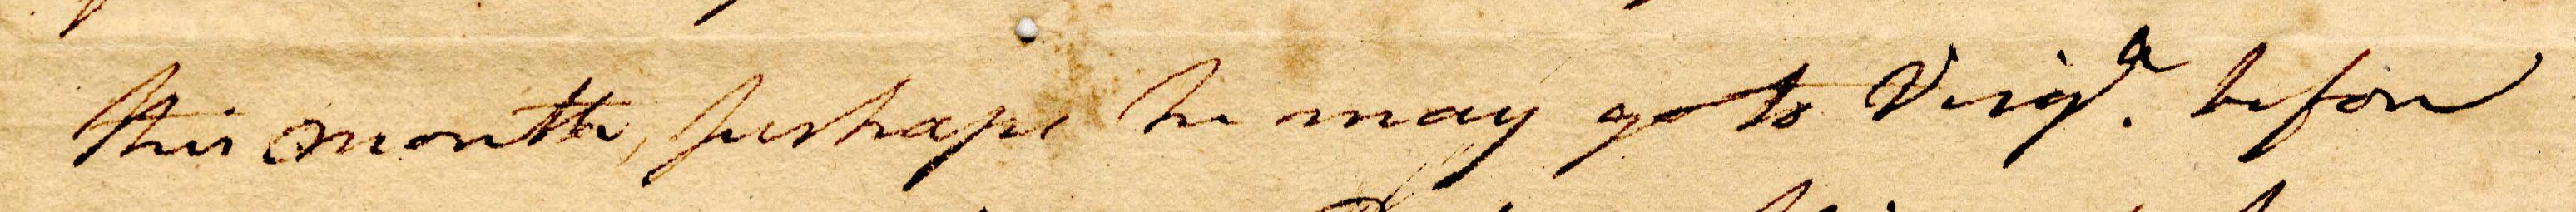this month, perhaps he may go to Virg^a. before
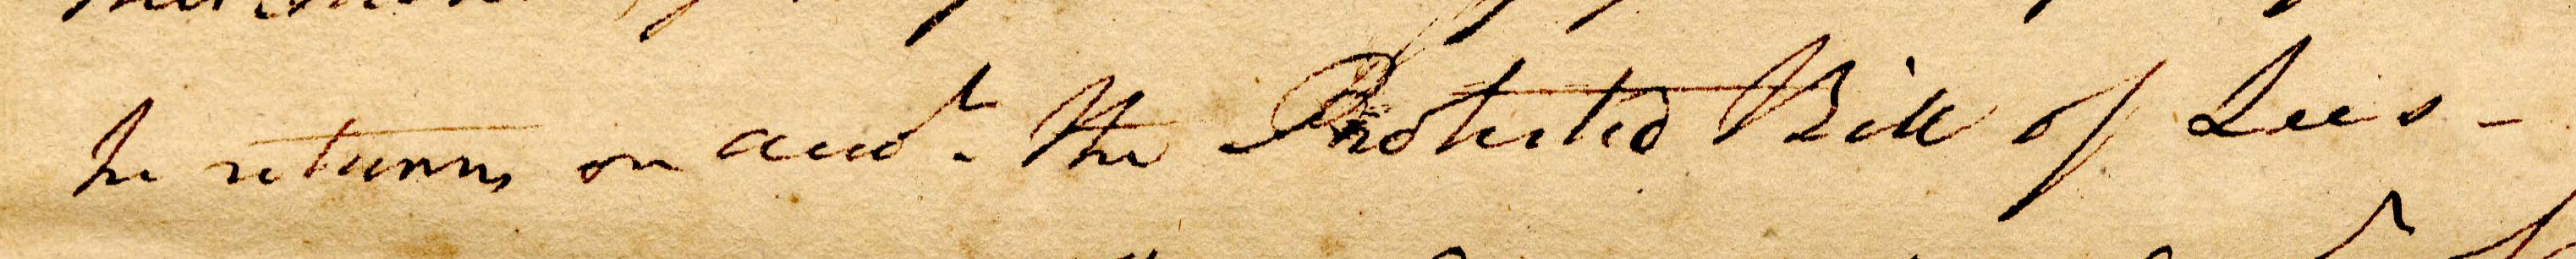he returns on acco^t. the Protected Bill of Lees-
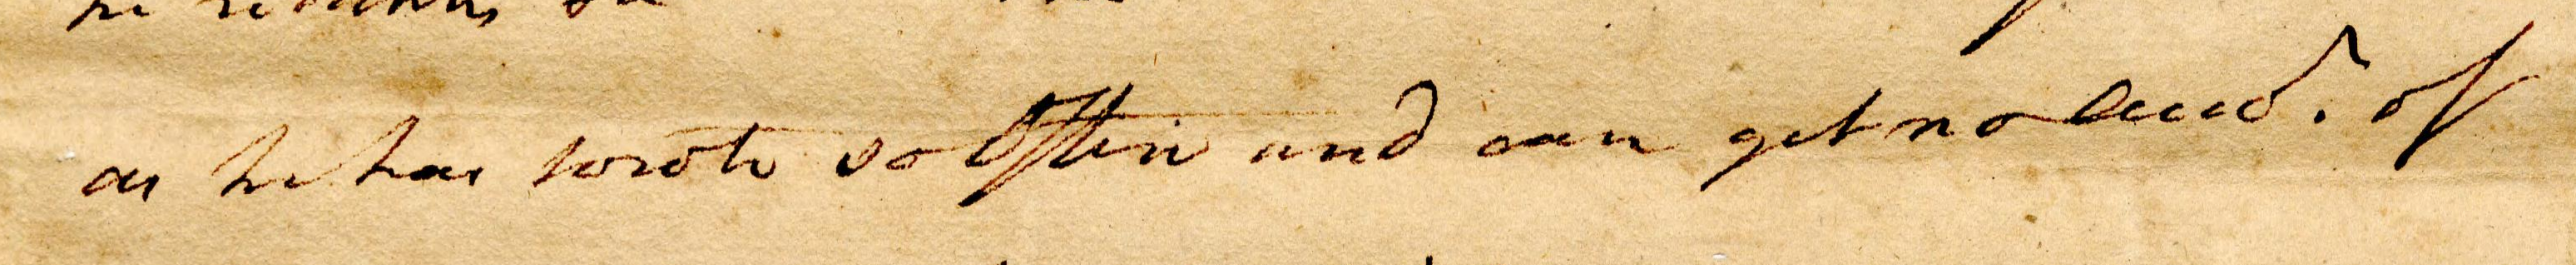as he has spoke so Often and can get no acco^t. of
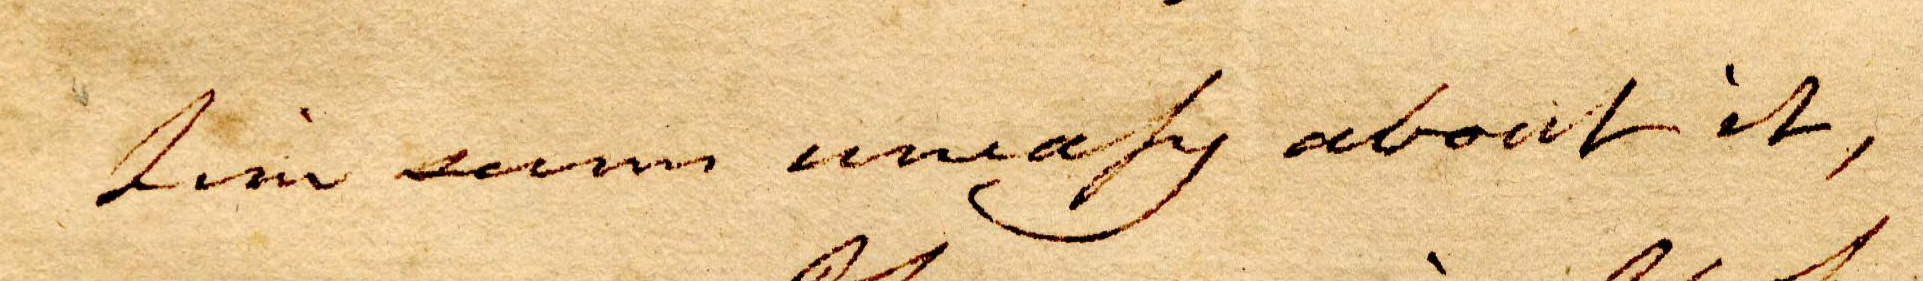his seem uneasy about it,
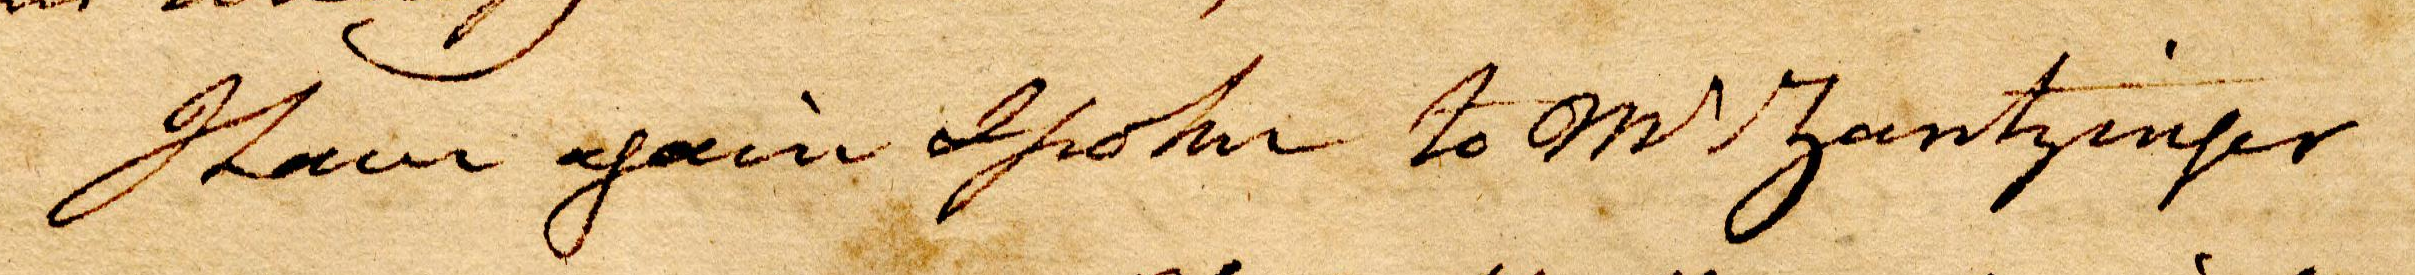I have again Spoken to M^r Zantzinger
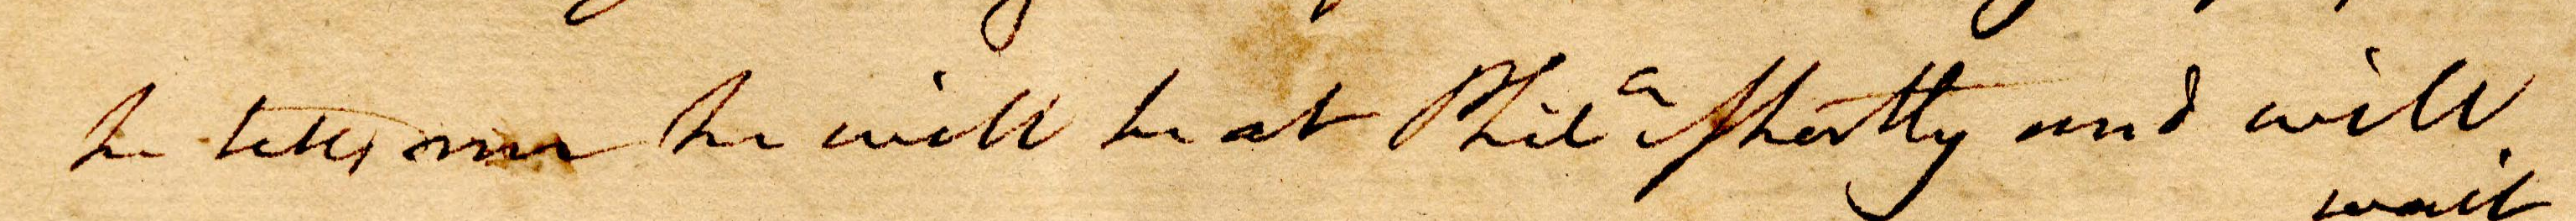he tells me he will be at Phil^a shortly and will
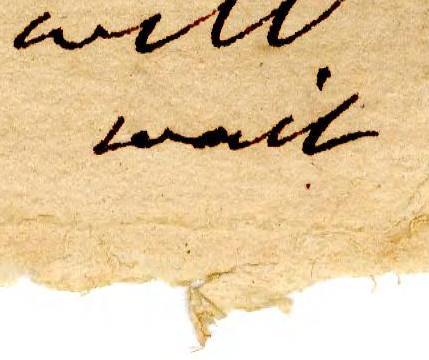he will
